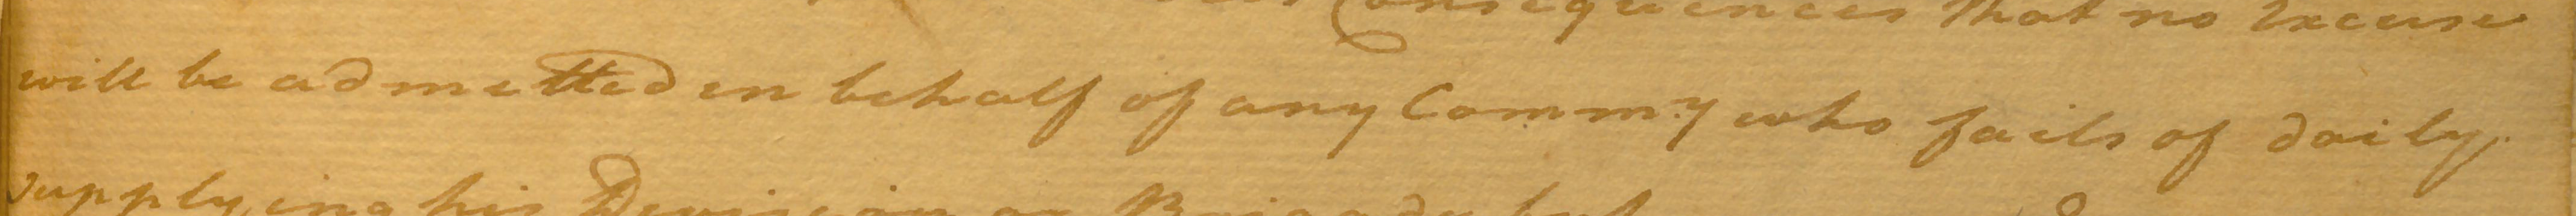will be admitted in behalf of any Comm^y. who fails of daily
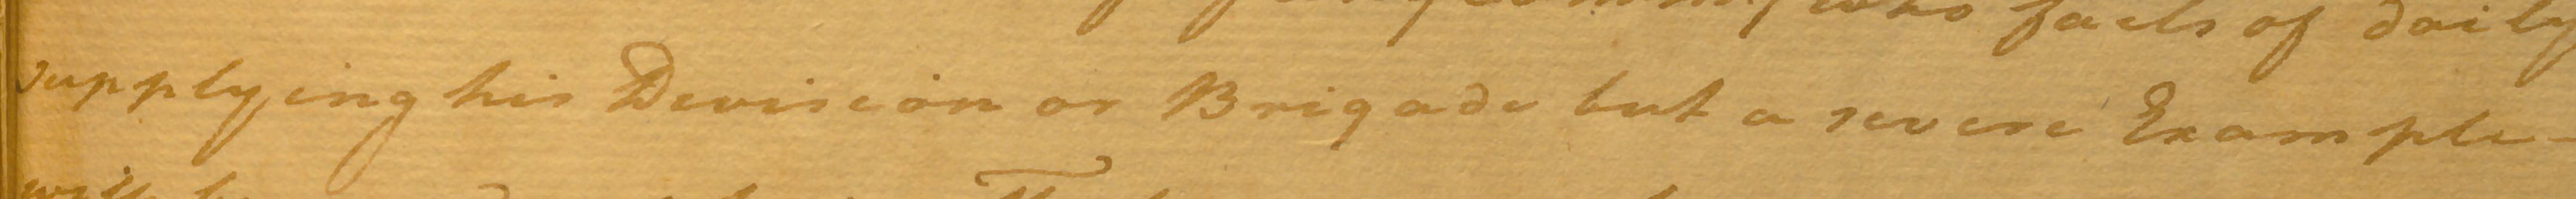supplying his Division or Brigade but a severe Example
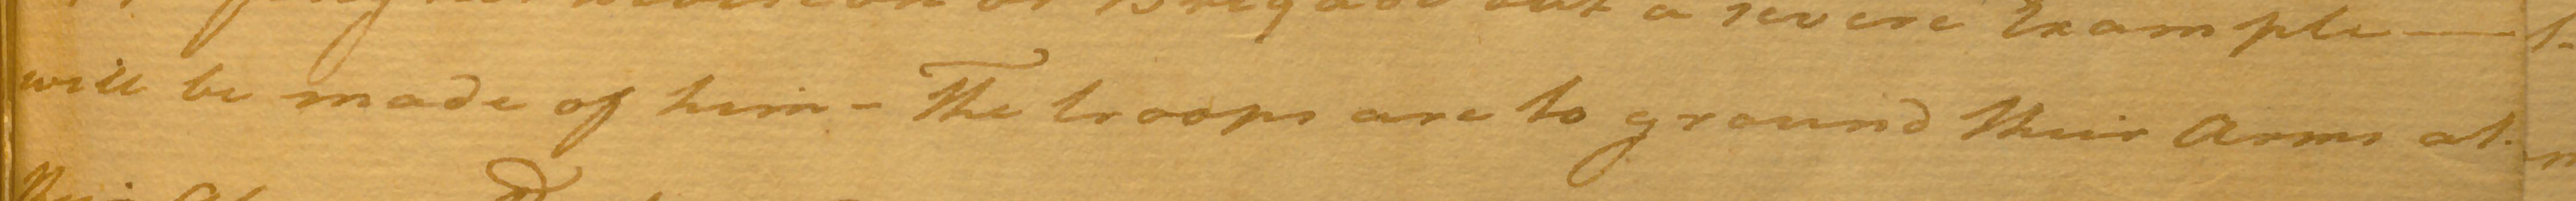will be made of him- The Troops are to ground their Arms at
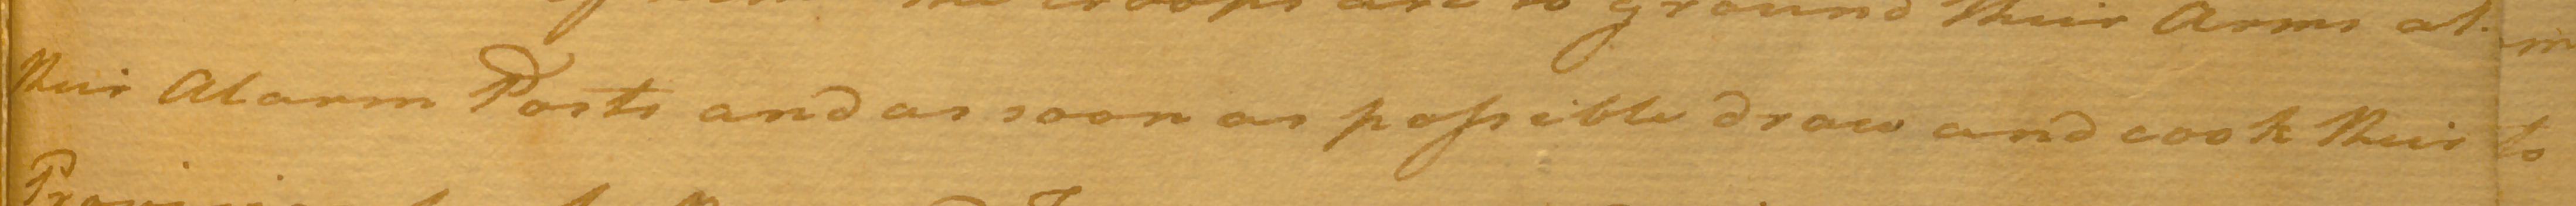their Alarm Posts and as soon as possible draw and cook their
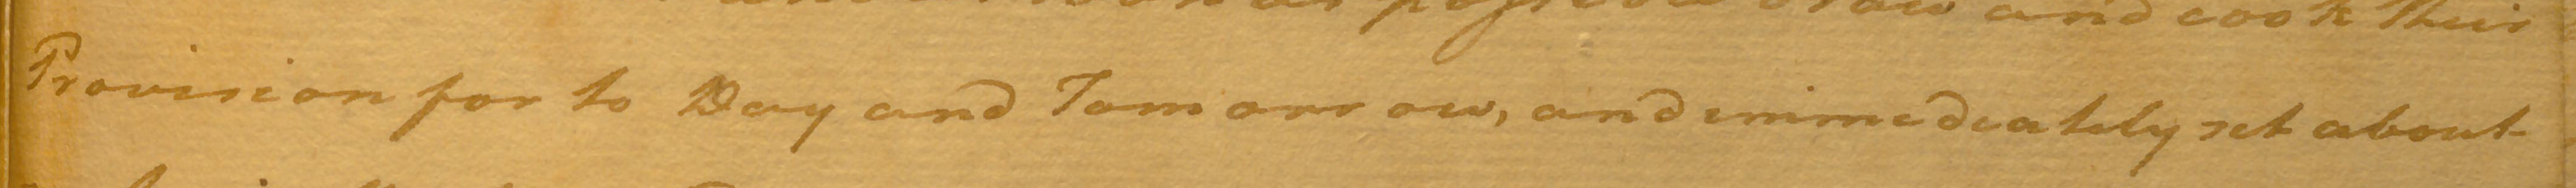Provision for to Day and Tomorrow, and immediately set about
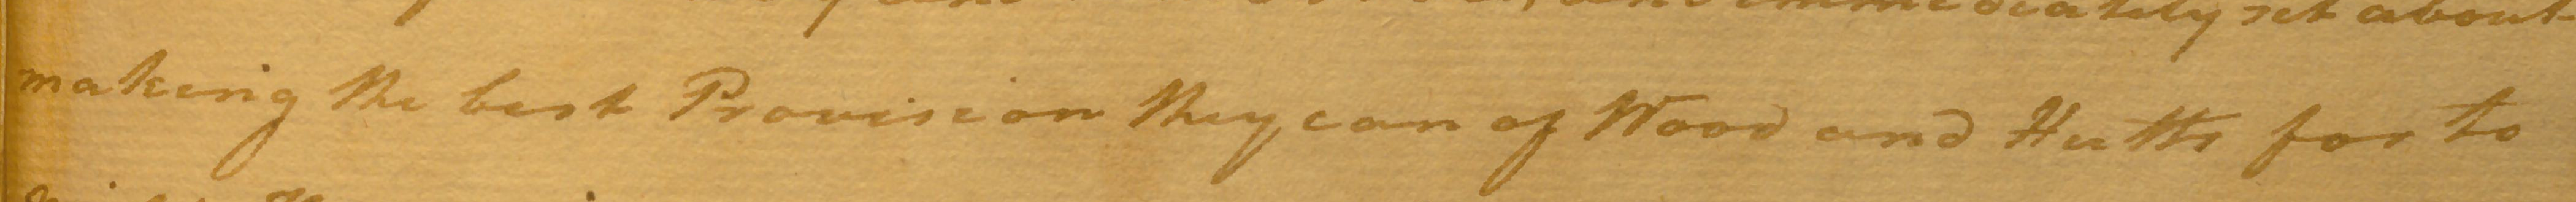making the best Provision they can of Wood and Hutts for to
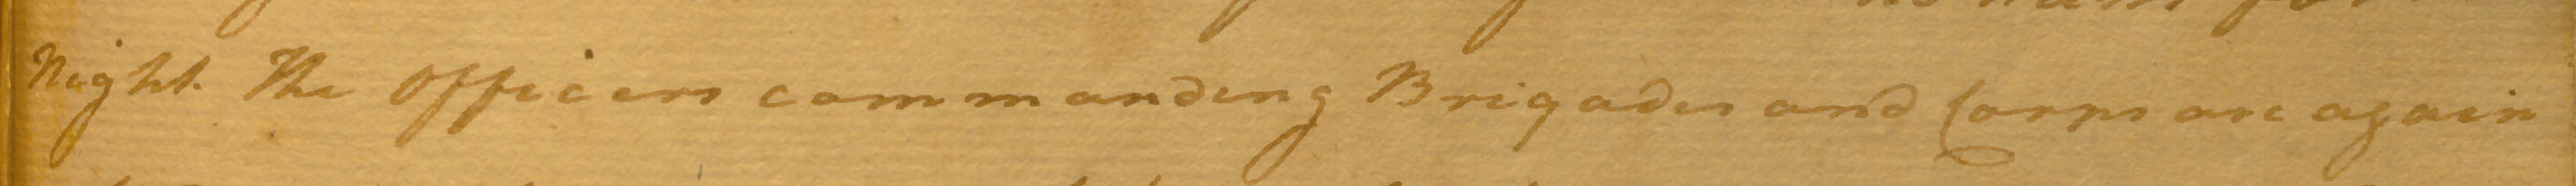night. The Officers commanding Brigades and Corps are again
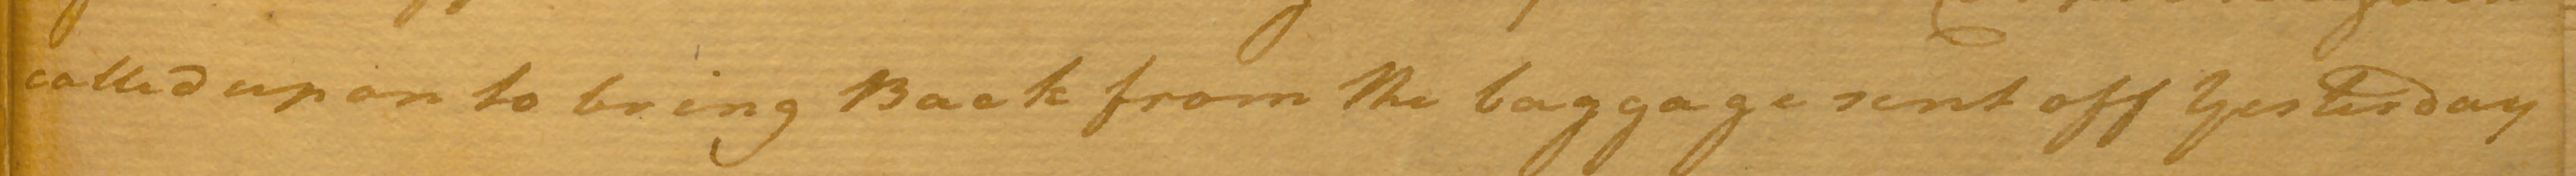called upon to bring Back from the baggage sent off Yesterday
